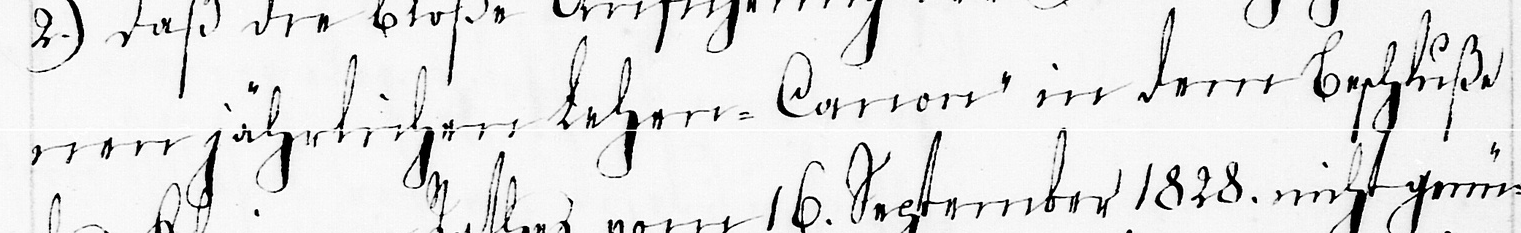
nen jährlichen Lehen-Canon“ in dem Beschluße
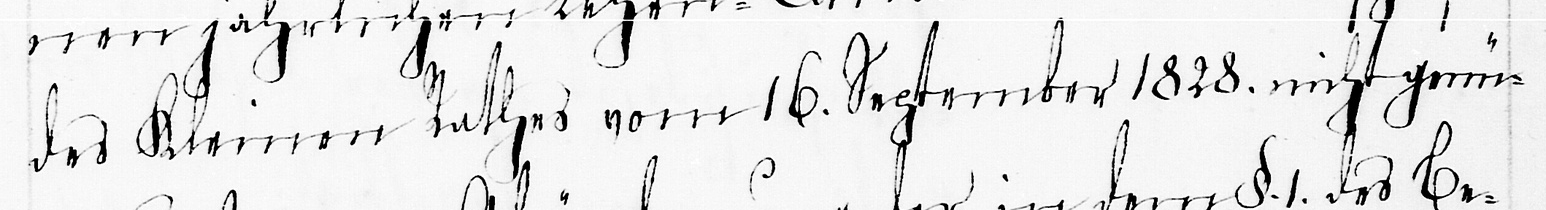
des Kleinen Rathes vom 16. September 1828. nicht genü¬
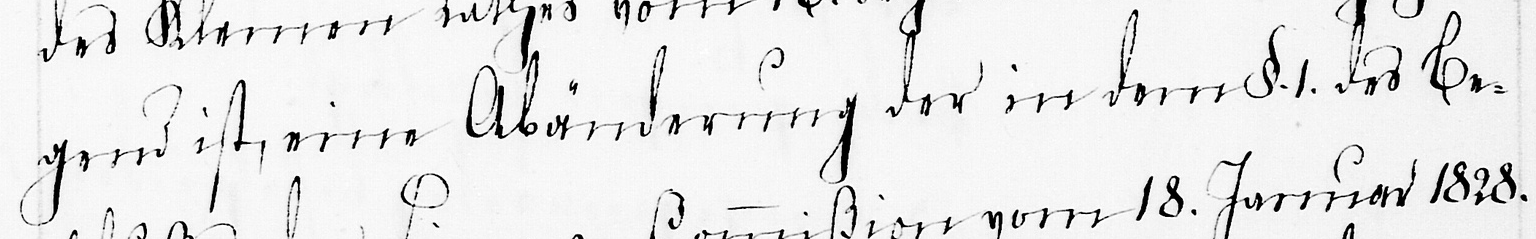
gend ist, eine Abänderung der in dem §. 1. des Be¬
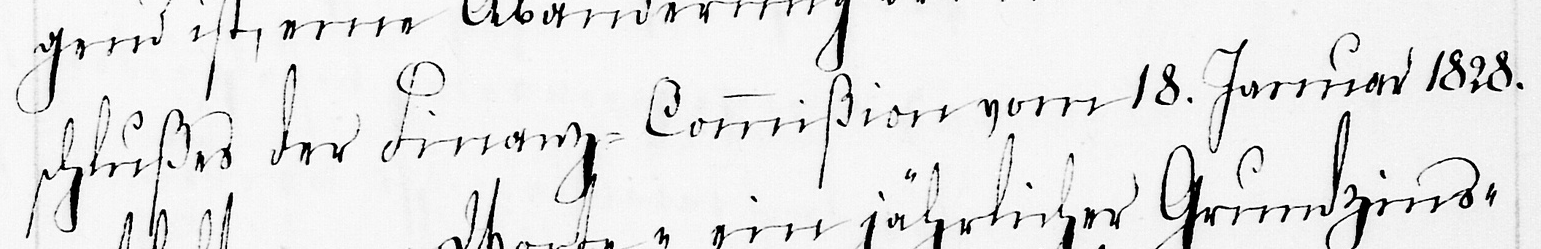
schlußes der Finanz-Commißion vom 18. Januar 1828.
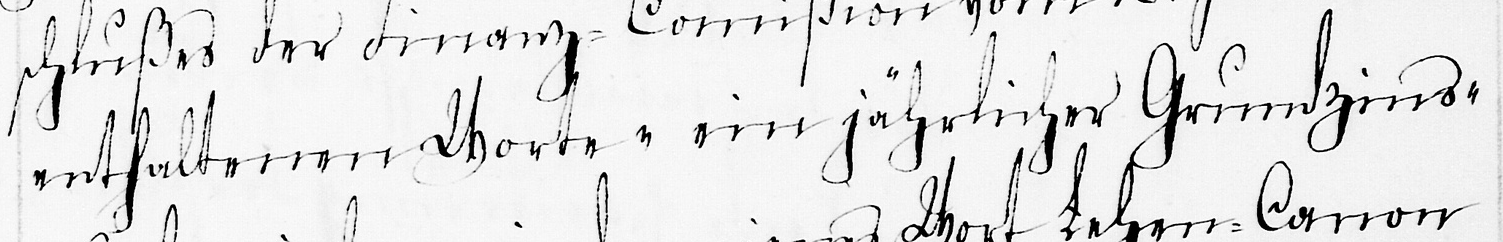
enthaltenen Worte „ein jährlicher Grundzins“
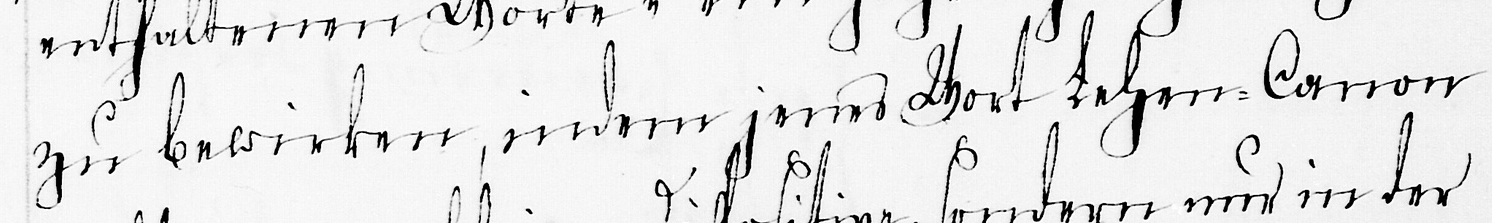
zu bewirken, indem jenes Wort Lehen-Canon
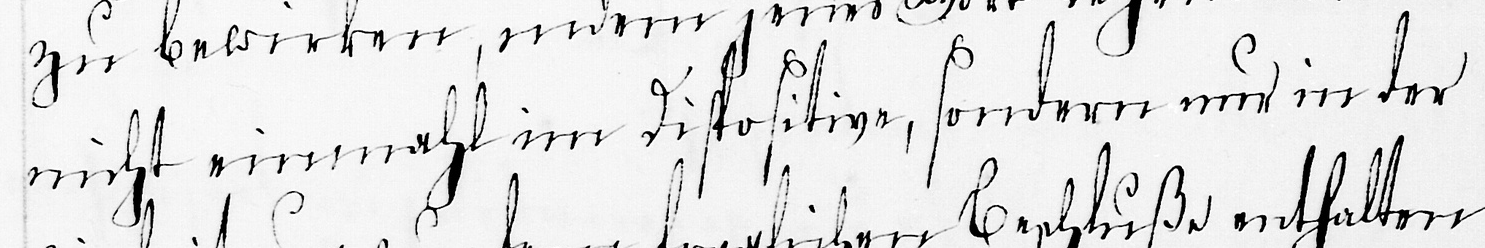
nicht einmahl im Dispositive, sondern nur in der
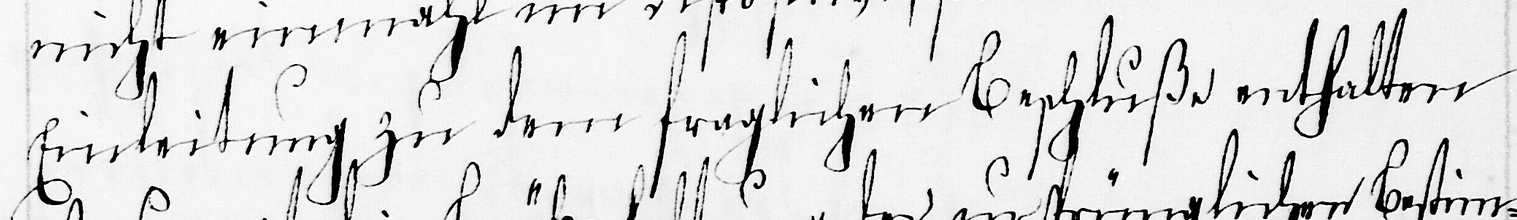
Einleitung zu dem fraglichen Beschluße enthalten
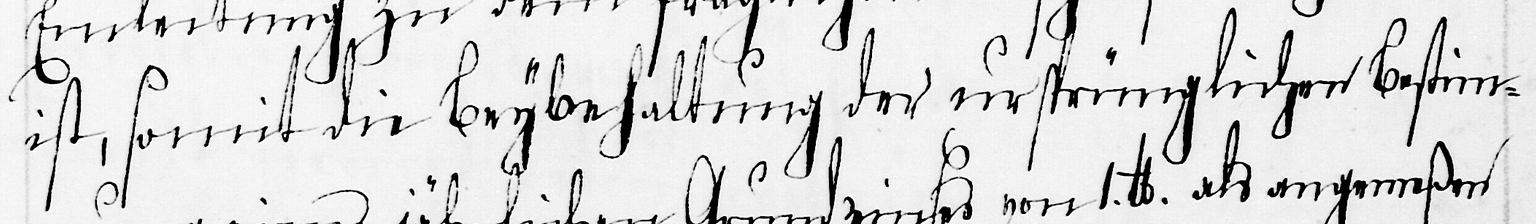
ist, somit die Beybehaltung der ursprünglichen Bestim¬
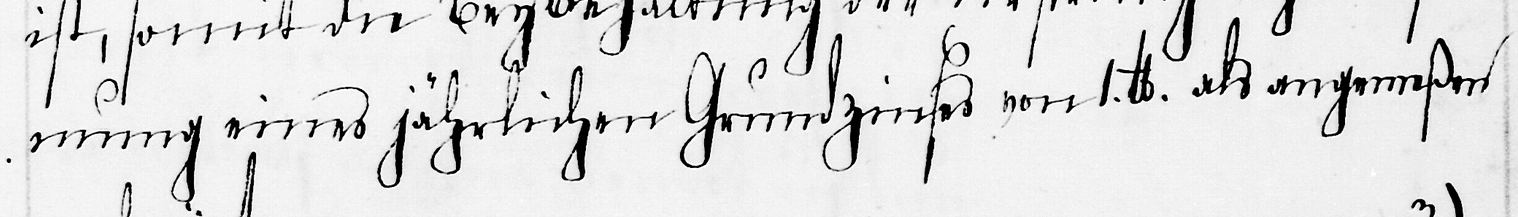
mung eines jährlichen Grundzinses von 1. lb. als angemeßen
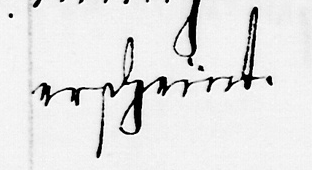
erscheint.
